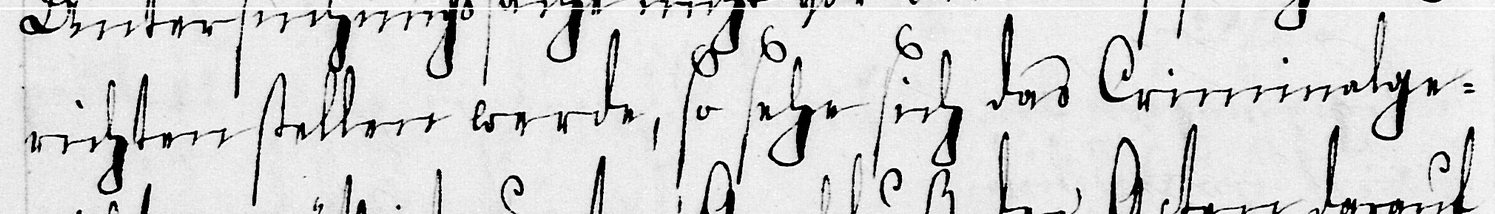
richten stellen werde, so sehe sich das Criminalge¬
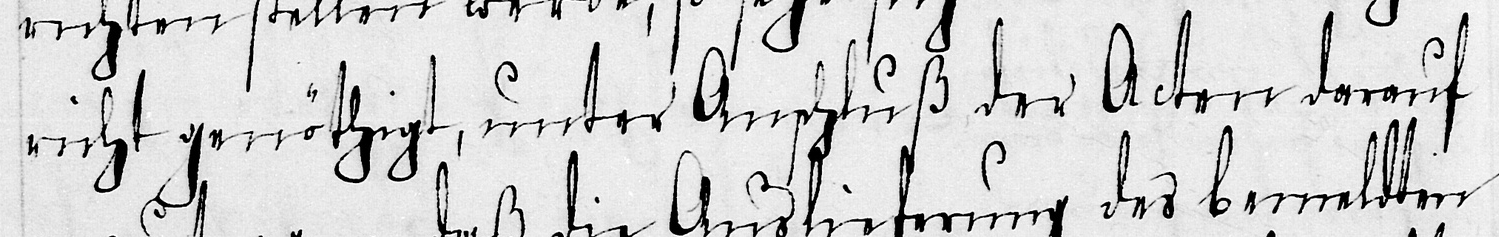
richt genöthigt, unter Anschluß der Acten darauf
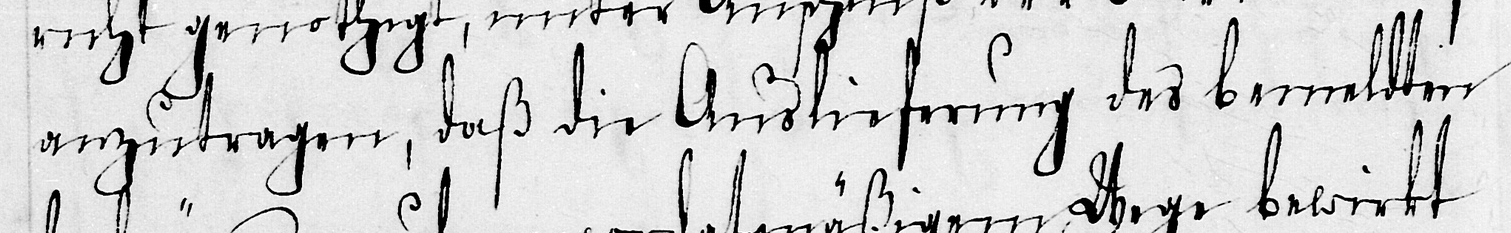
anzutragen, daß die Auslieferung des bemeldten
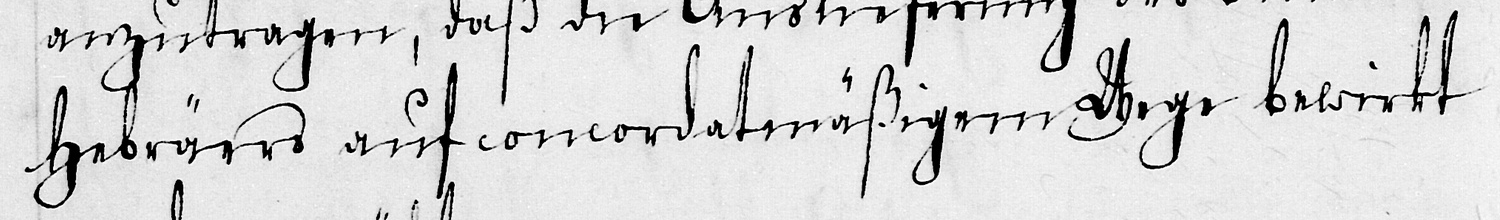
Hebräers auf concordatmäßigem Wege bewirkt
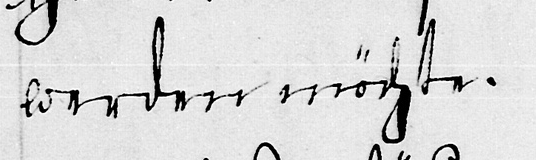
werden möchte.
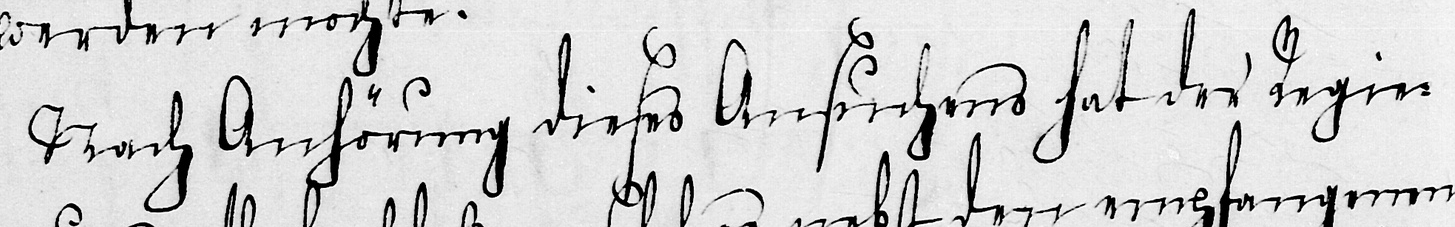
Nach Anhörung dieses Ansuchens hat der Regie¬
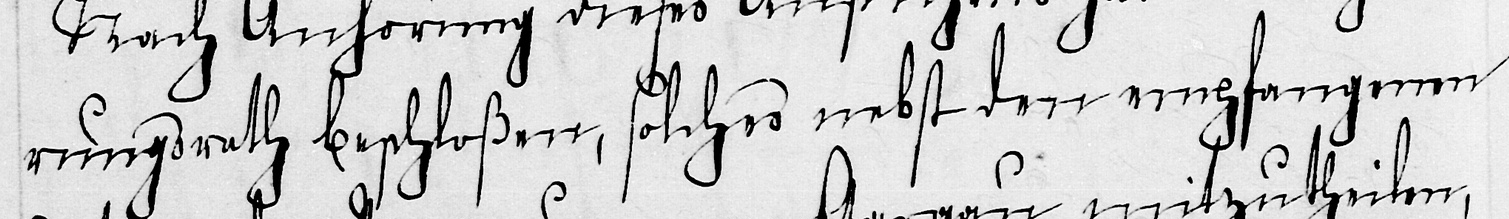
rungsrath beschloßen, solches nebst den empfangenen
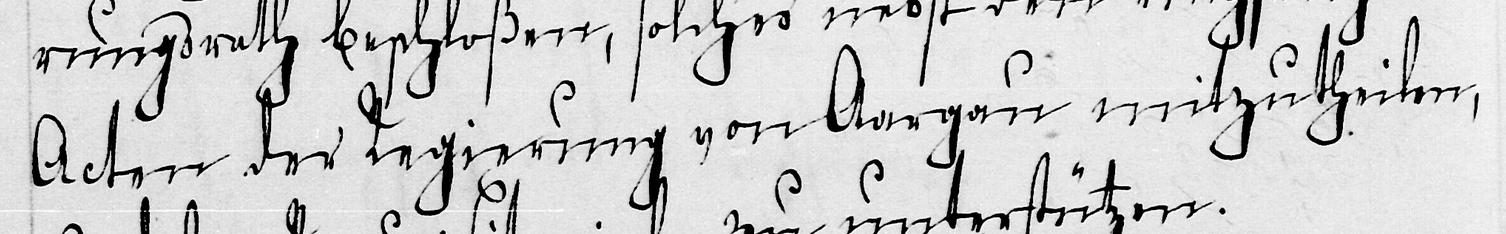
Acten der Regierung von Aargau mitzutheilen,
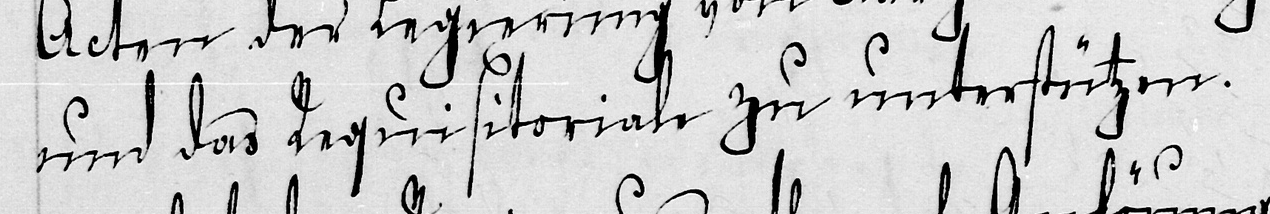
und das Requisitoriale zu unterstützen.
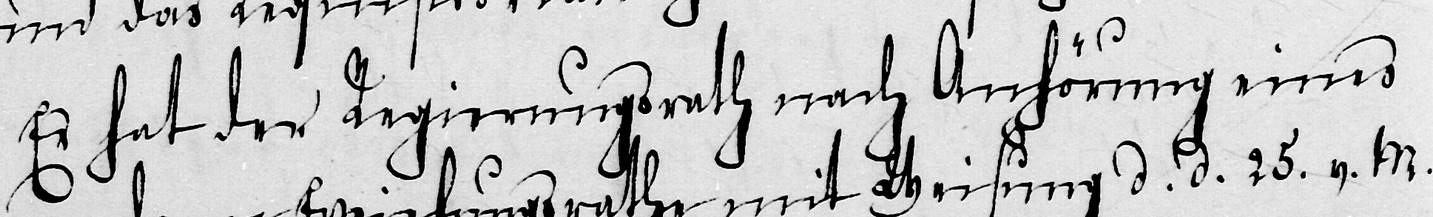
Es hat der Regierungsrath nach Anhörung eines
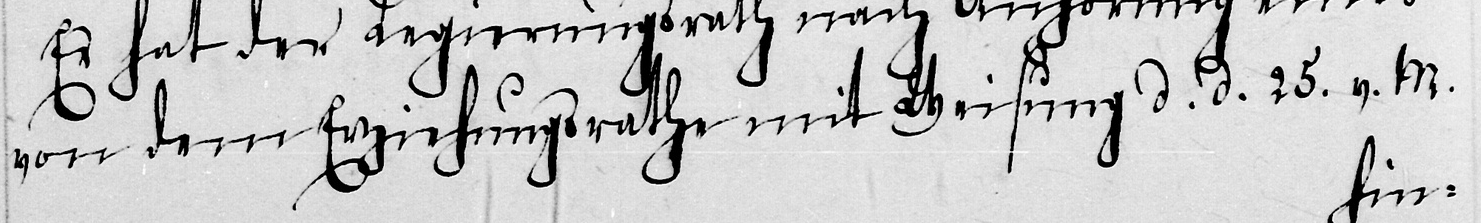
von dem Erziehungsrathe mit Weisung d. d. 25. v. M.
